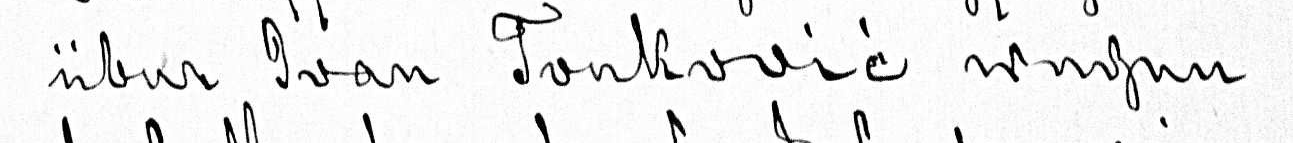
über Ivan Tonković wegen
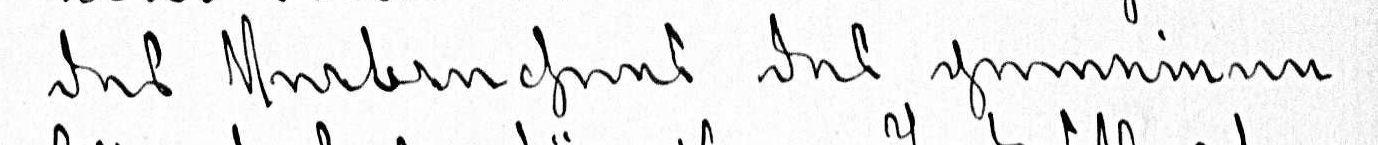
des Verbrechens des gemeinen
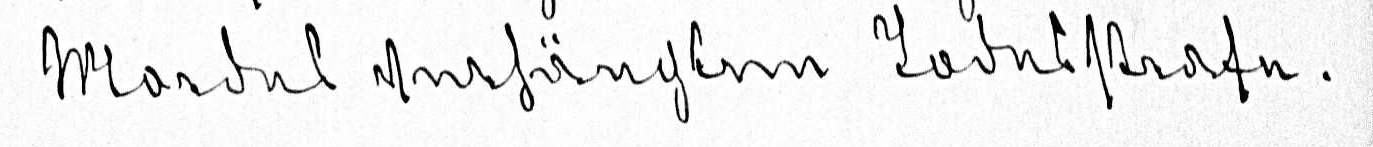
Mordes verhängten Todesstrafe.
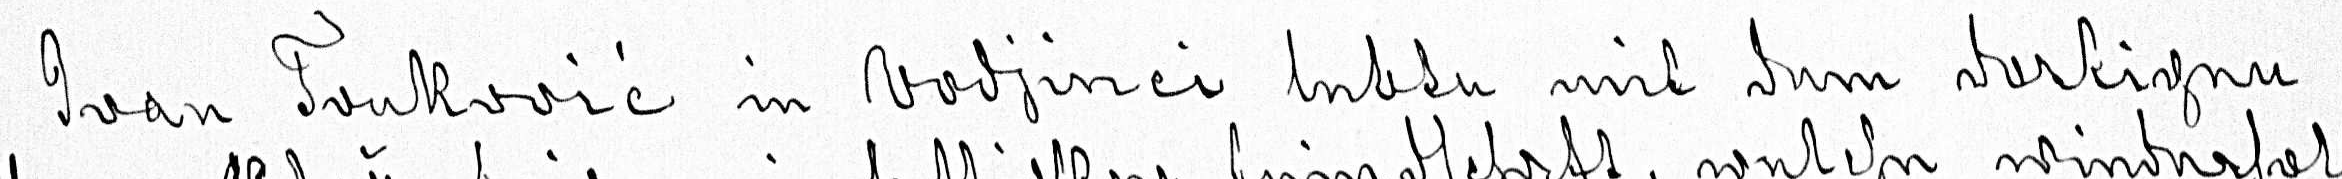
Ivan Tonković in Vodjinci lebte mit dem dortigen
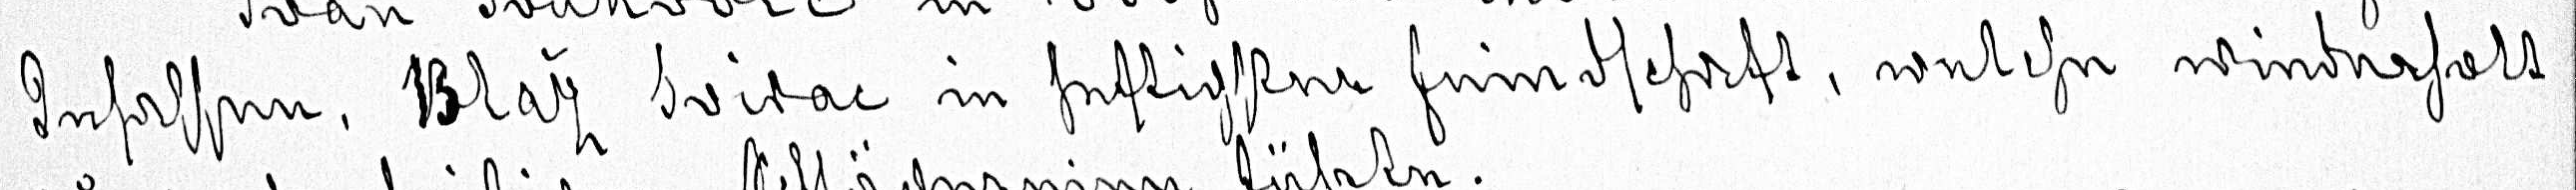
Insassen, Blaž Svirac in heftigsten Feindschaft, welche wiederholt
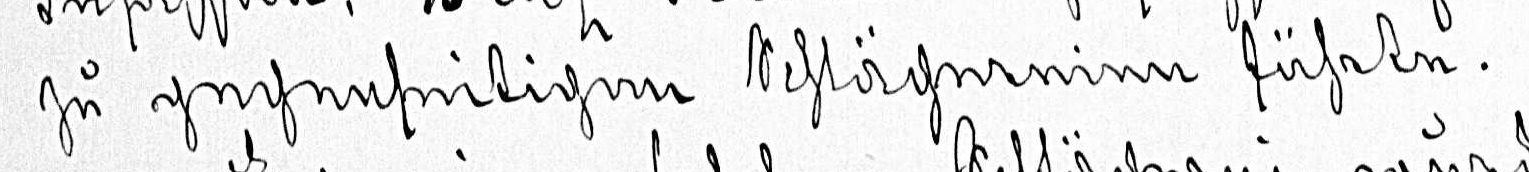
zu gegenseitigen Schlägerein führte.
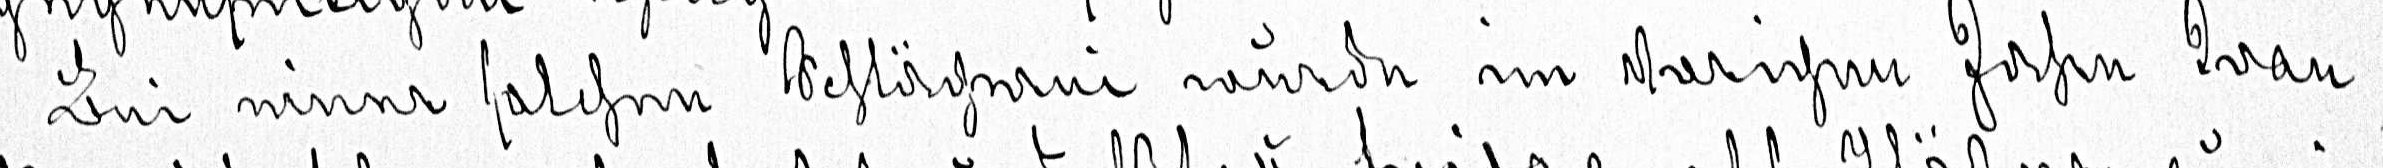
Bei einer solchen Schlägerei wurde im vorigen Jahre Ivan
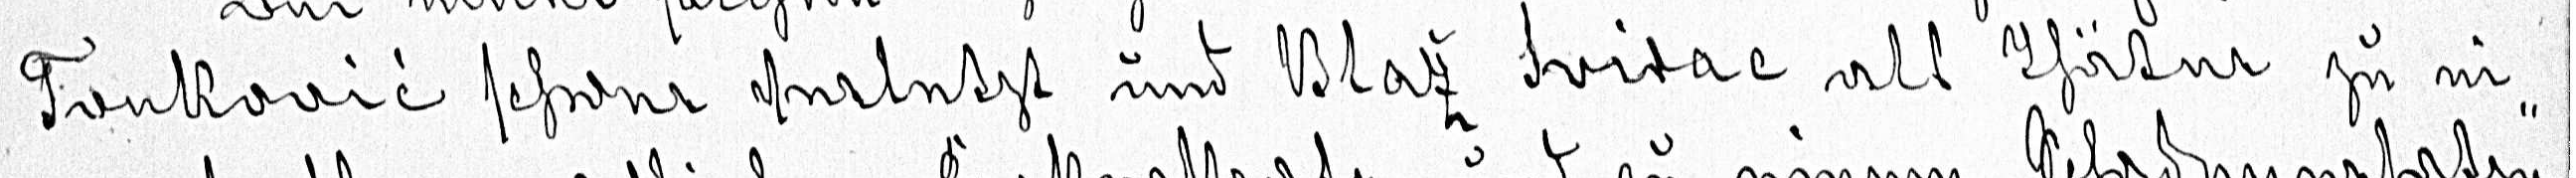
Tonković schwer verletzt und Blaž Svirac als Thäter zu ei¬
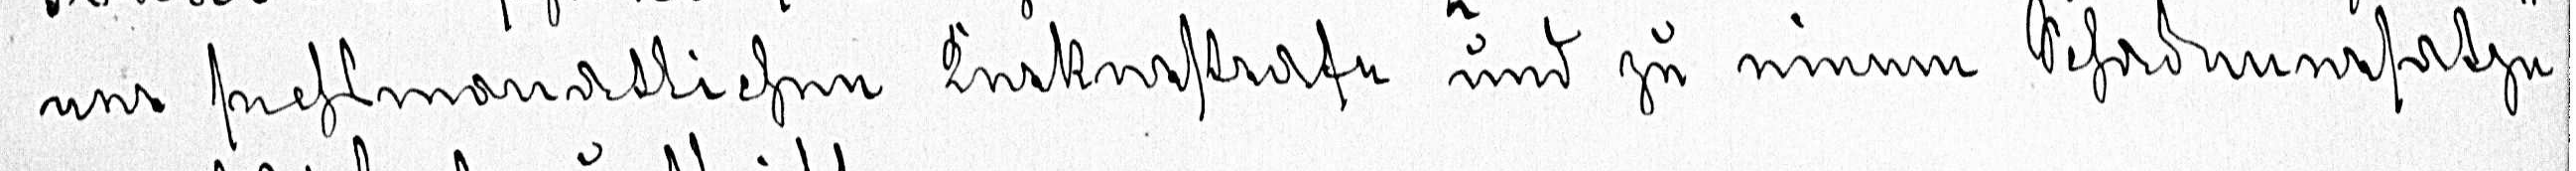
ner sechsmonatlichen Kerkerstrafe und zu einem Schadenersatze
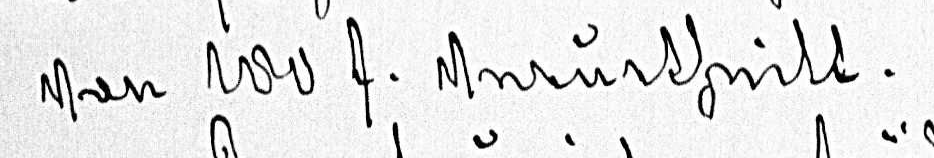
von 100f verurtheilt.
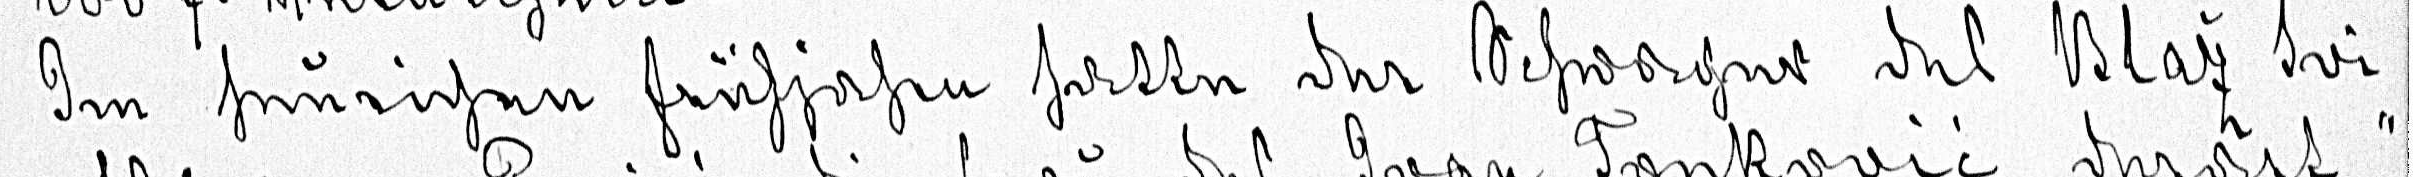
Im heurigen Frühjahre hatte der Schwager des Blaž Svi¬
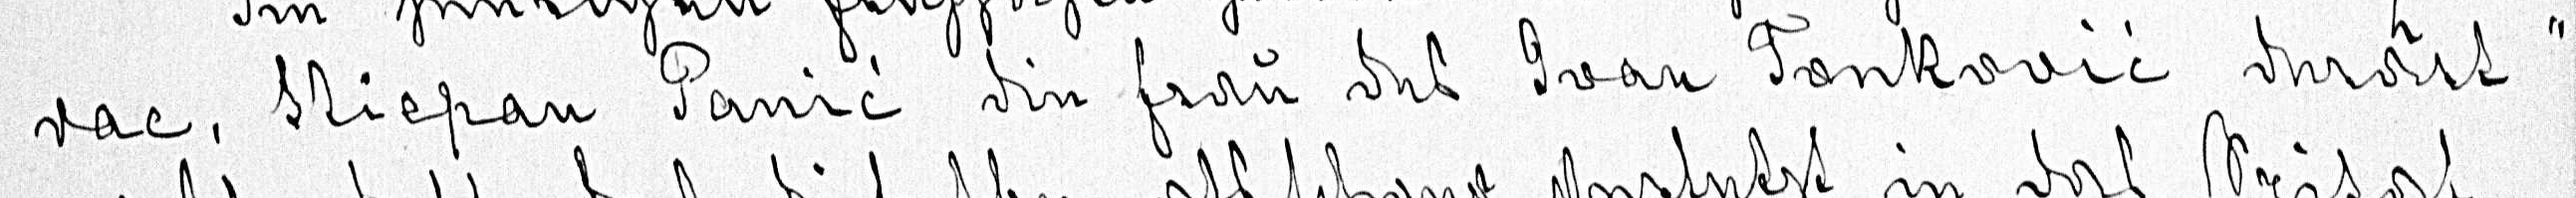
rac, Stiepan Panić die Frau des Ivan Tonković derart
